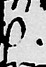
M.
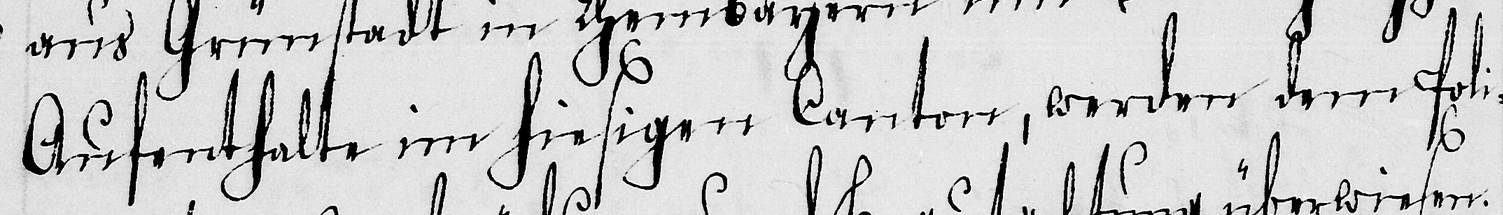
Aufenthalte im hiesigen Canton, werden dem Poli¬
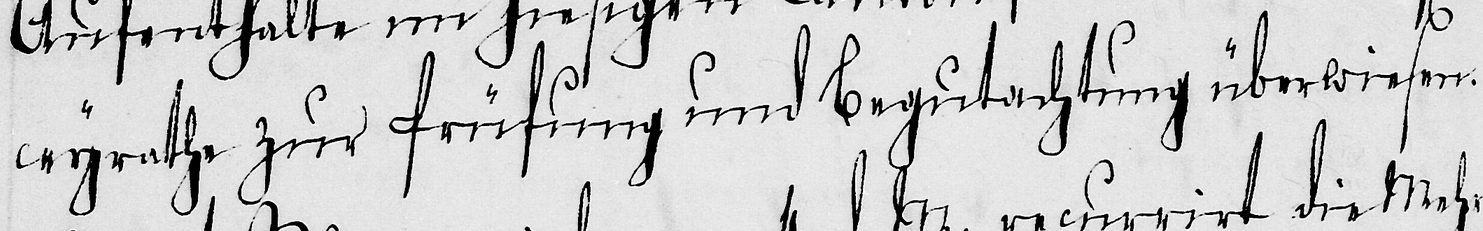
ceyrathe zur Prüfung und Begutachtung überwiesen.
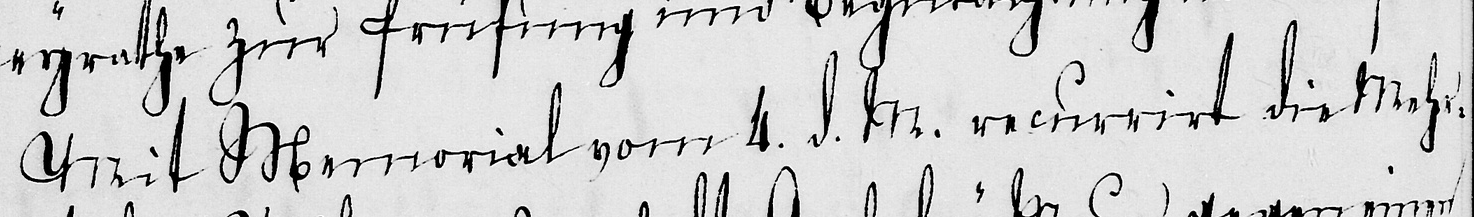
Mit Memorial vom 4. d. M. recurirt die Mehr¬
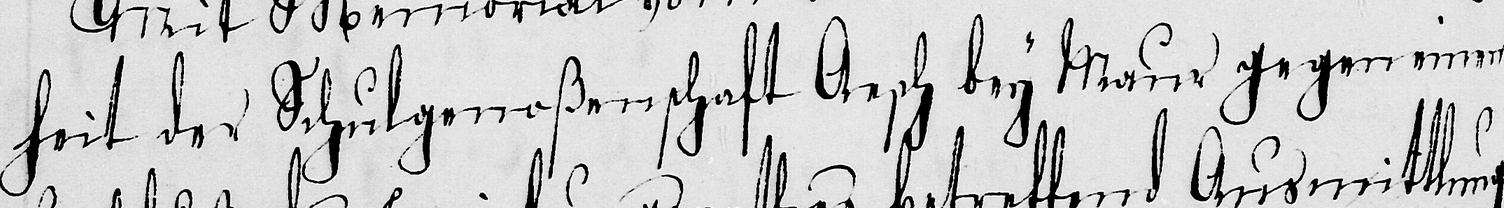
heit der Schulgenoßenschaft Aesch bey Maur gegen einen
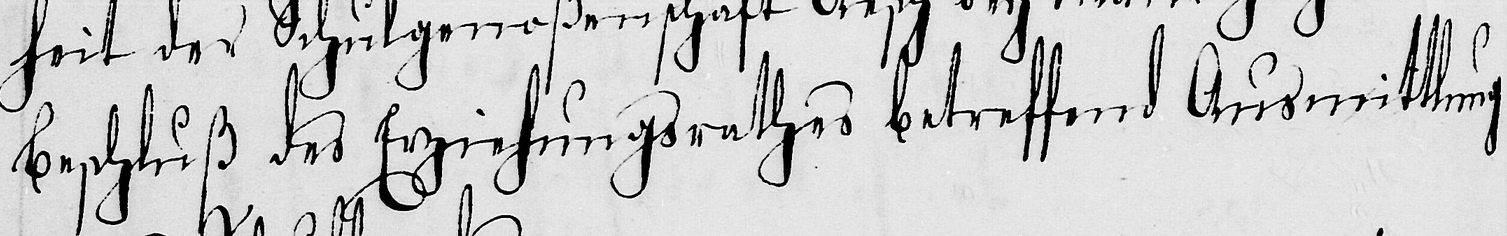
Beschluß des Erziehungsrathes betreffend Ausmittlung
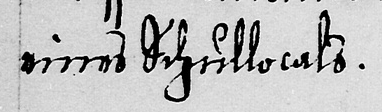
eines Schullocales.
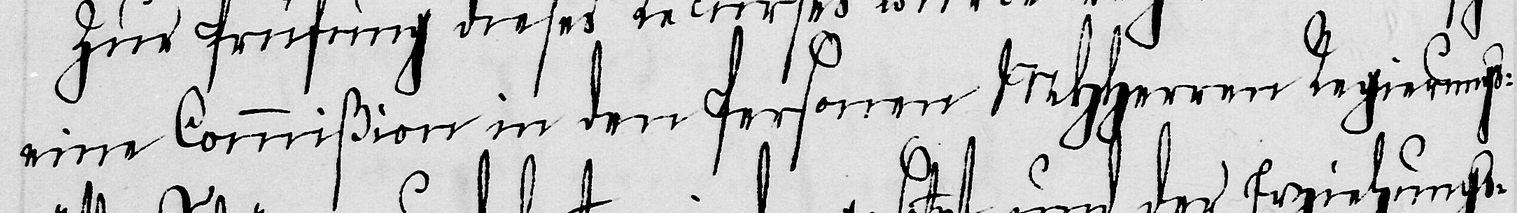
eine Commißion in den Personen MHHerren Regierung¬
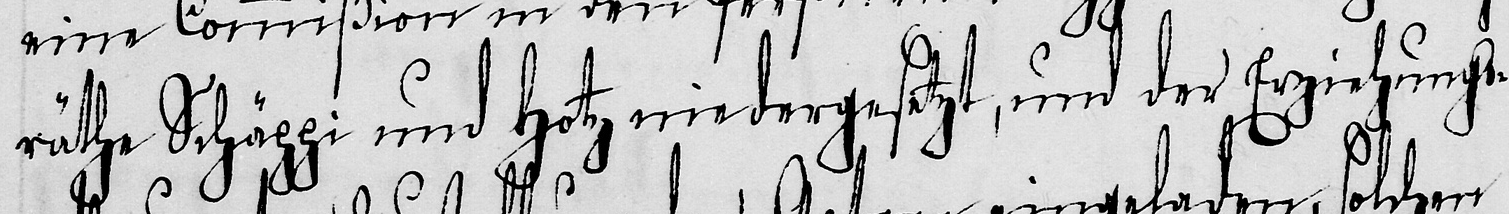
räthe Schäppi und Hotz niedergesetzt, und der Erziehung¬
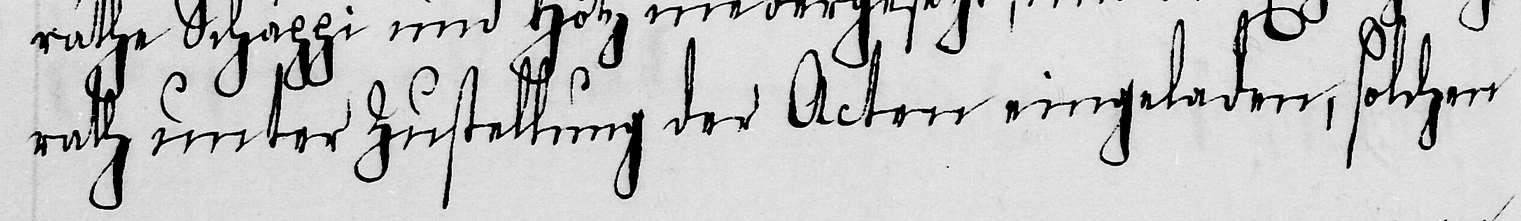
srath unter Zustellung der Acten eingeladen, solchen
